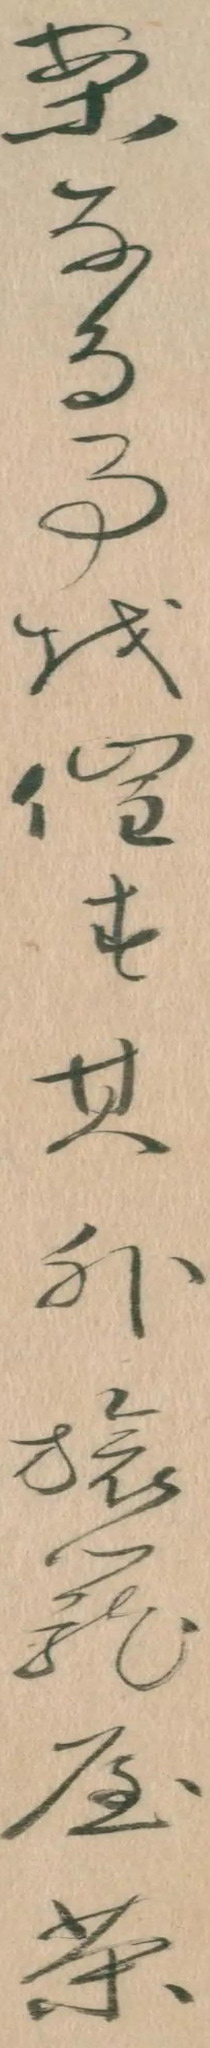案なる事を催す其外旅籠屋茶
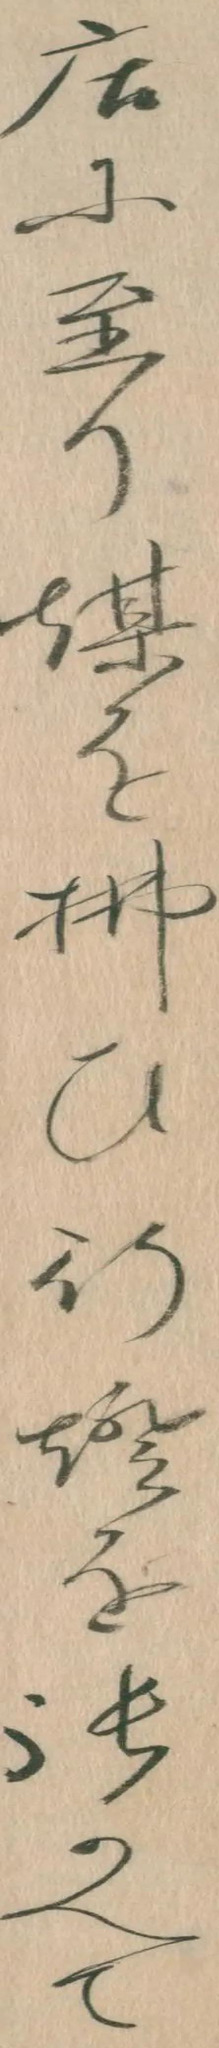店に至り煤を払ひ行燈を張かへて
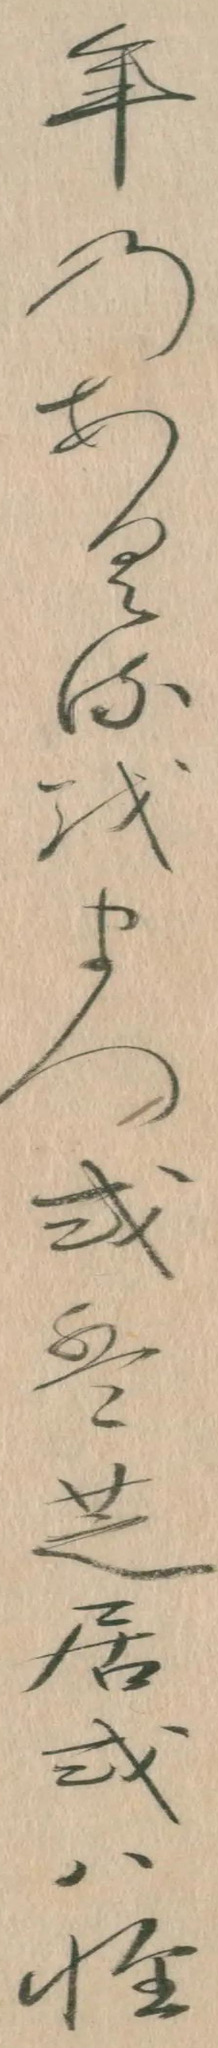年のあくるをまつ或は芝居或は軽
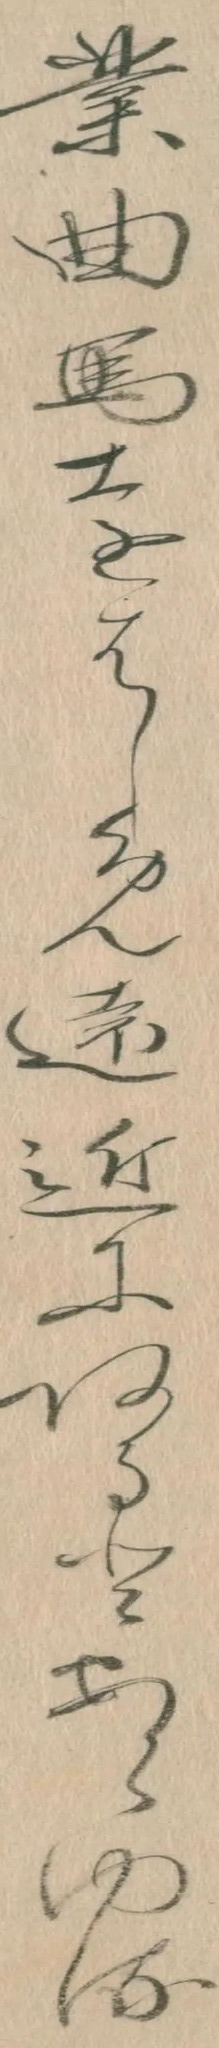業曲馬をはしめ遠近にあるとあらゆる
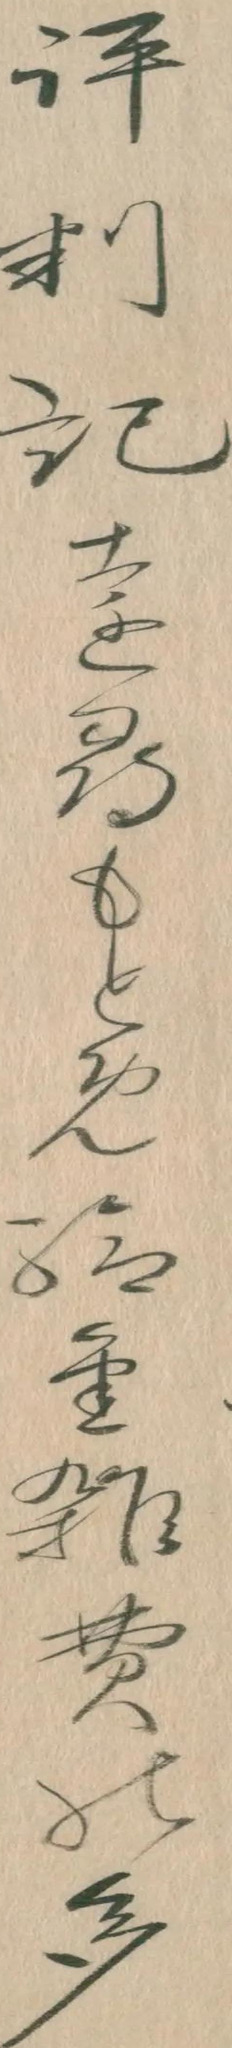評判記を尋もとめ給金雑費の多
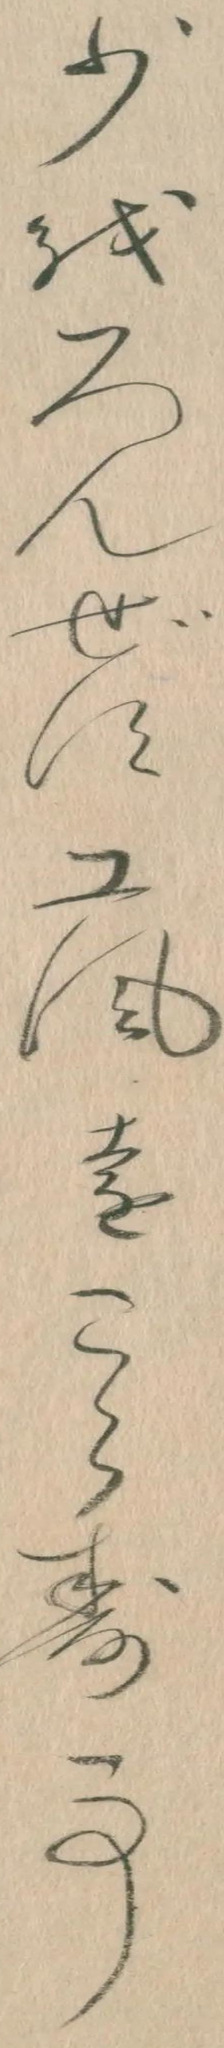少をろんせす工風をこらす事
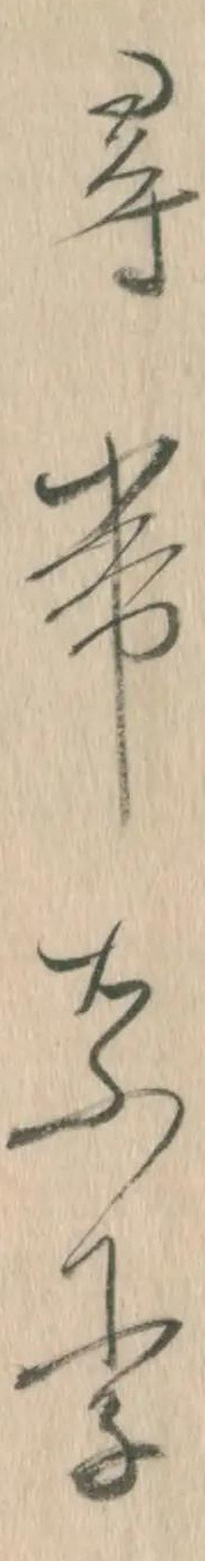尋常なり

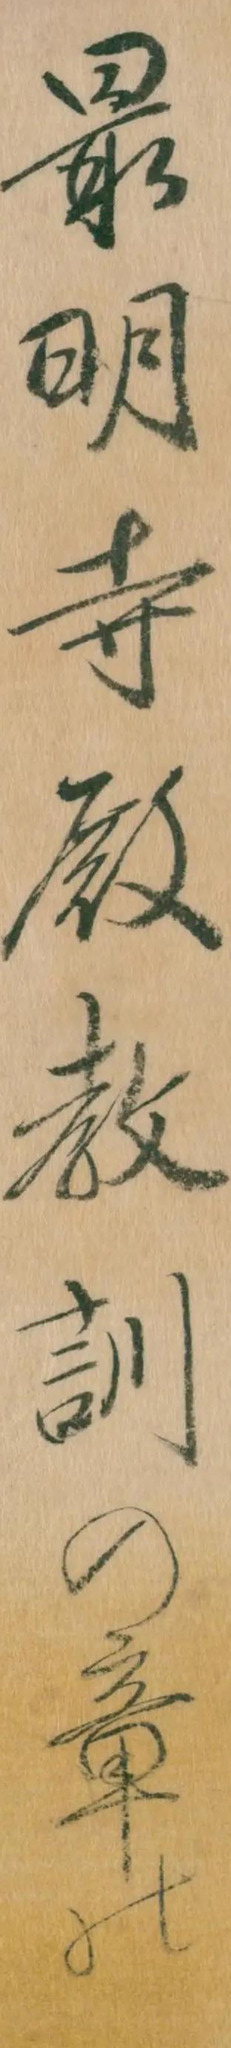最明寺殿教訓の章の
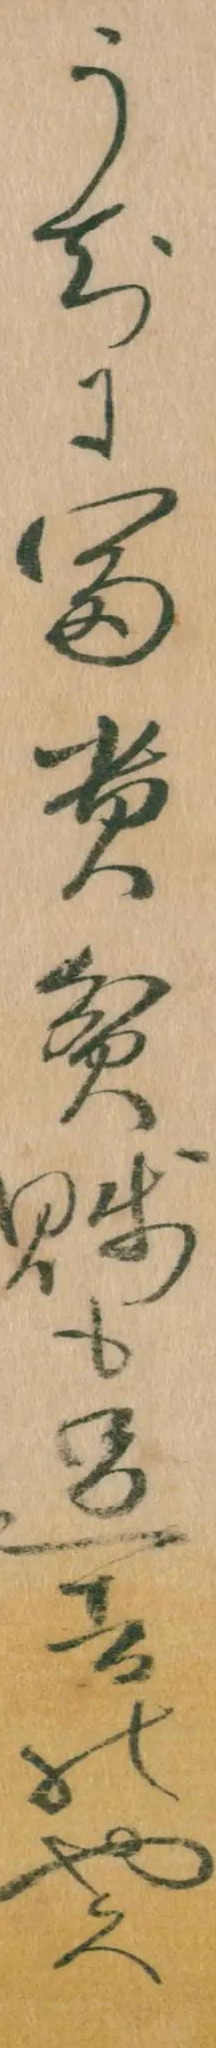うちに冨貴貧賤も過去のやく
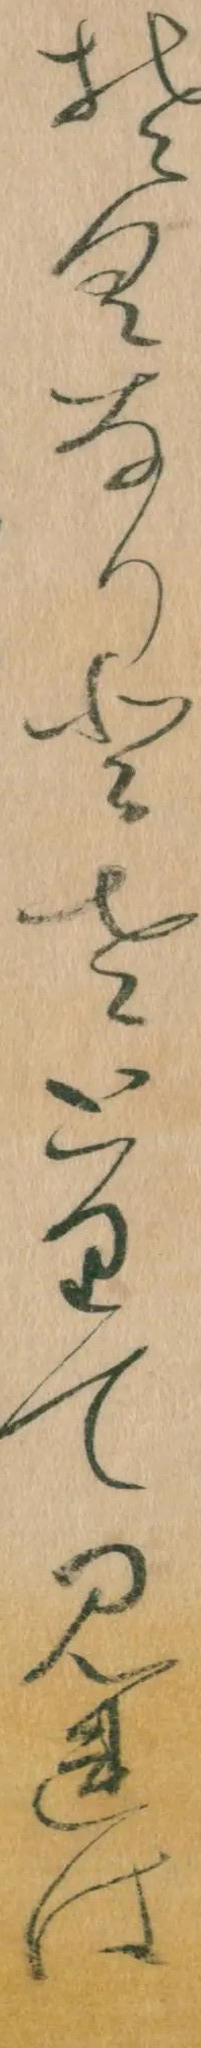そくなりとをとわて見れは
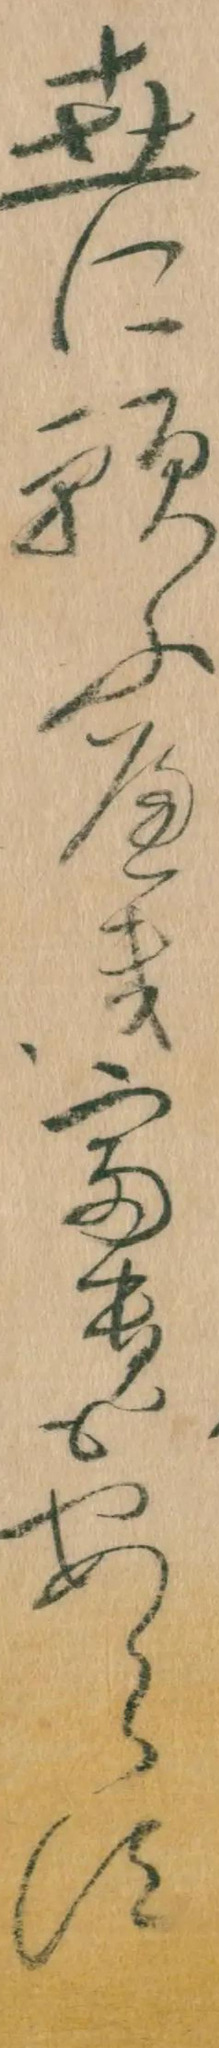直に願ふへき富きもあらす
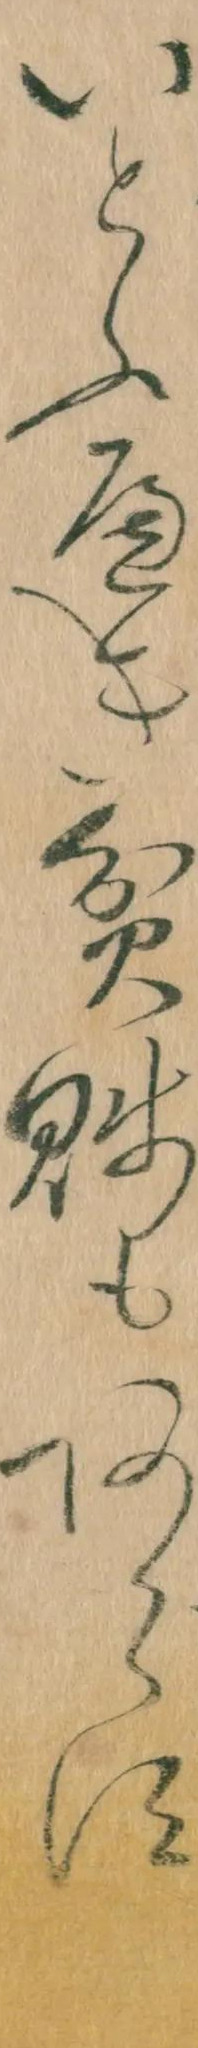いとふへき貧賤もあらす
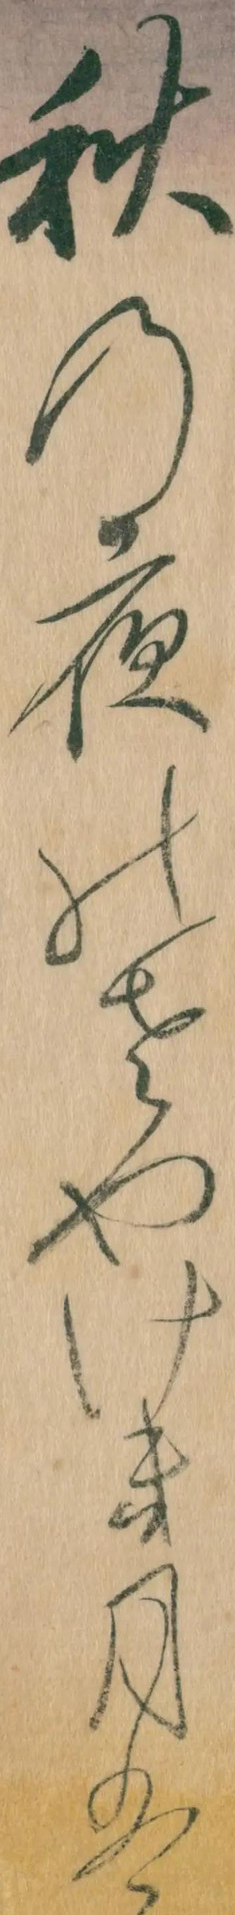秋の夜のせやけき月は
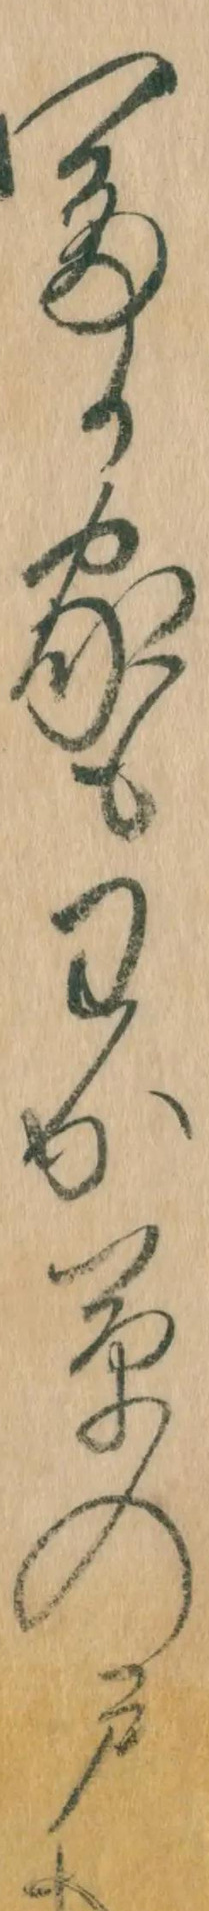冨の家もわか草の戸も
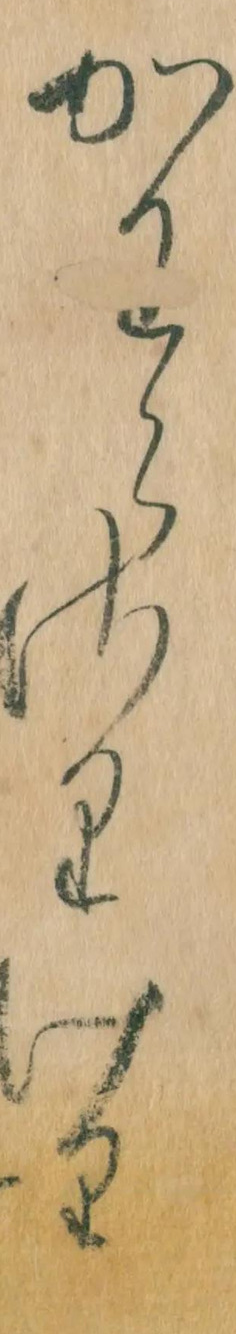かりてさりけり
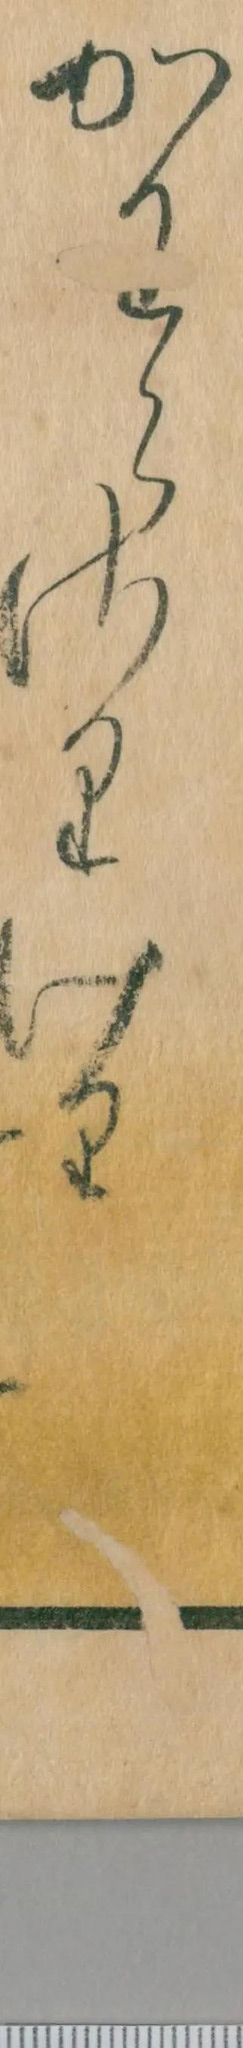かりてさりけり
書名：俗語之種. [1]
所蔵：国立国会図書館 National Diet Library, JAPAN
